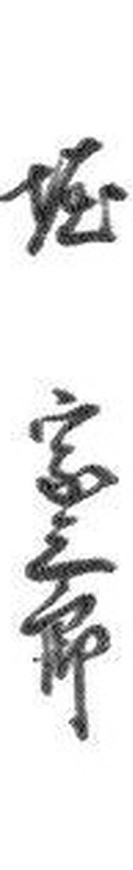堀宗三郎

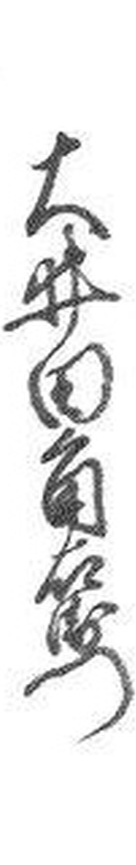大井田角右衛門
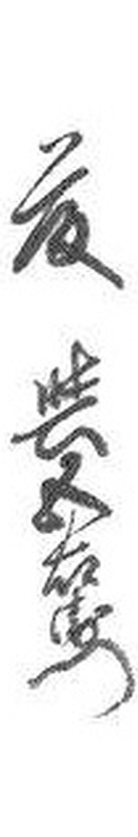藤与五右衛門
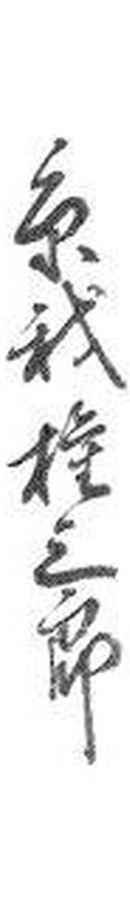京我権三郎
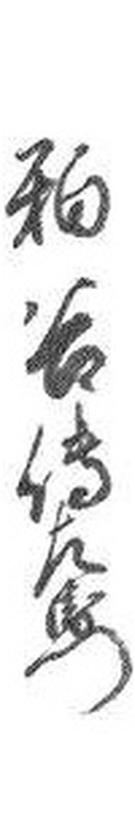粕谷伝左衛門
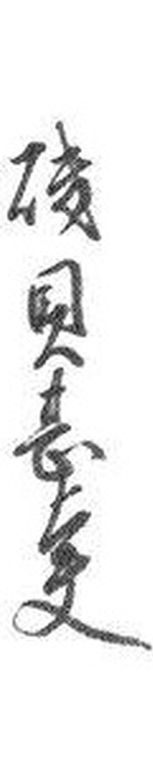磯貝甚太夫
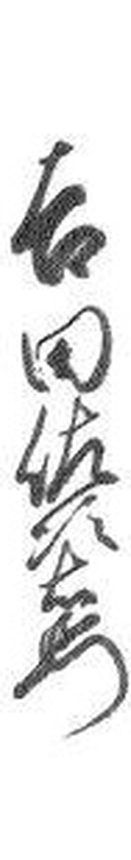吉田佐次右衛門
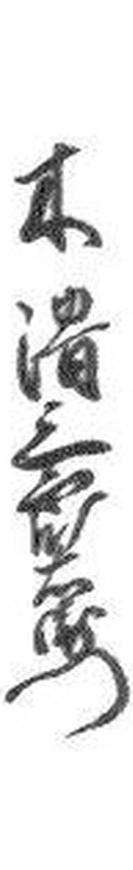木滑三郎右衛門
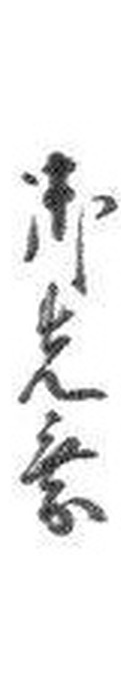御先乗
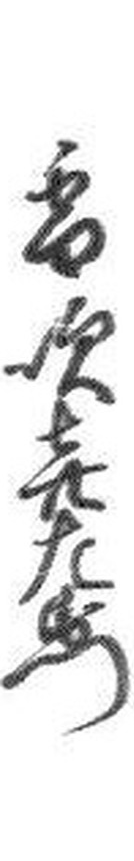香吹喜左衛門
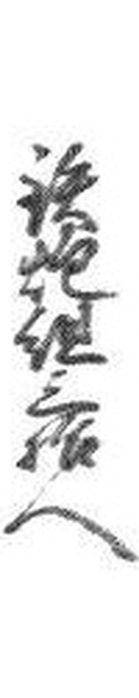鉄炮組三拾人
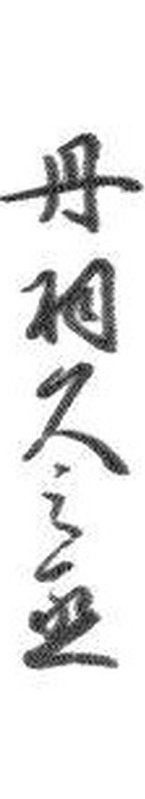丹羽久之丞
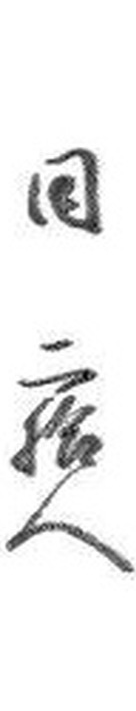同二拾人
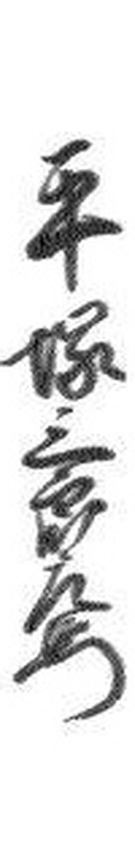平塚三郎左衛門
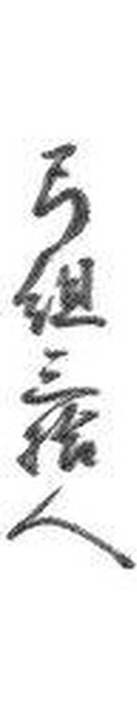弓組三拾人
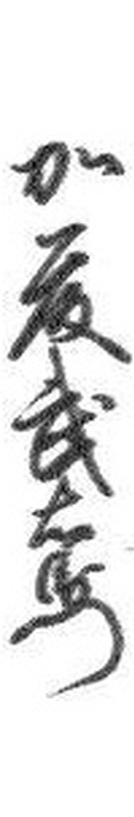加藤武右衛門
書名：家譜 四 忠昌公 従寛永七年到正保四年
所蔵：福井県文書館 Fukui Prefectural Archives
